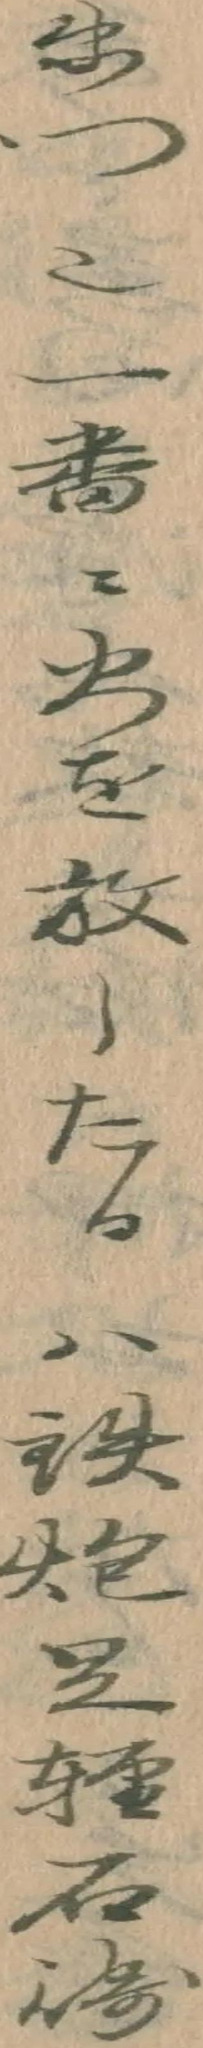衛門也一番に火を放したるは鉄炮足軽石崎
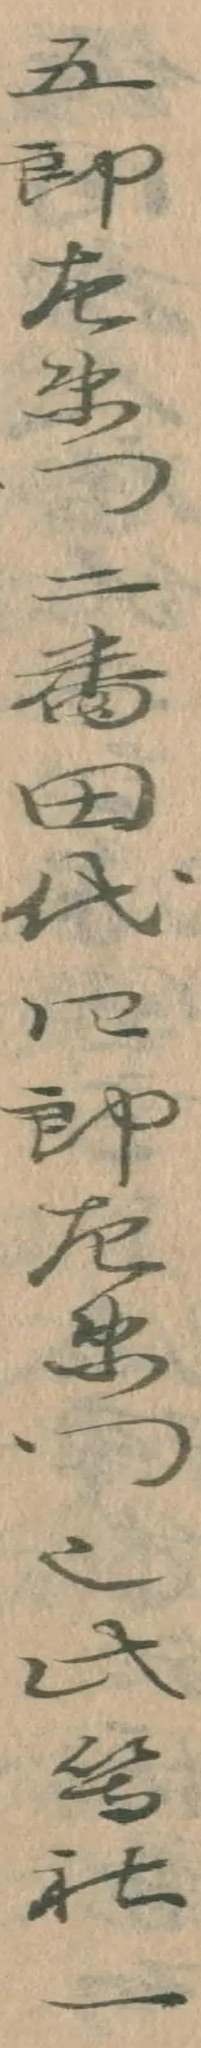五郎左衛門二番田代四郎左衛門也此等仕一
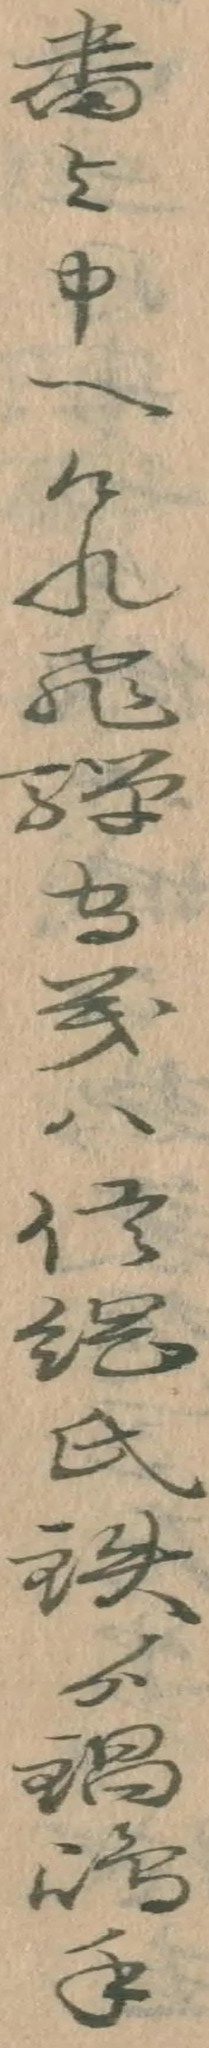番与申へけれ飛騨守義は信綱氏鉄ゟ鍋島手
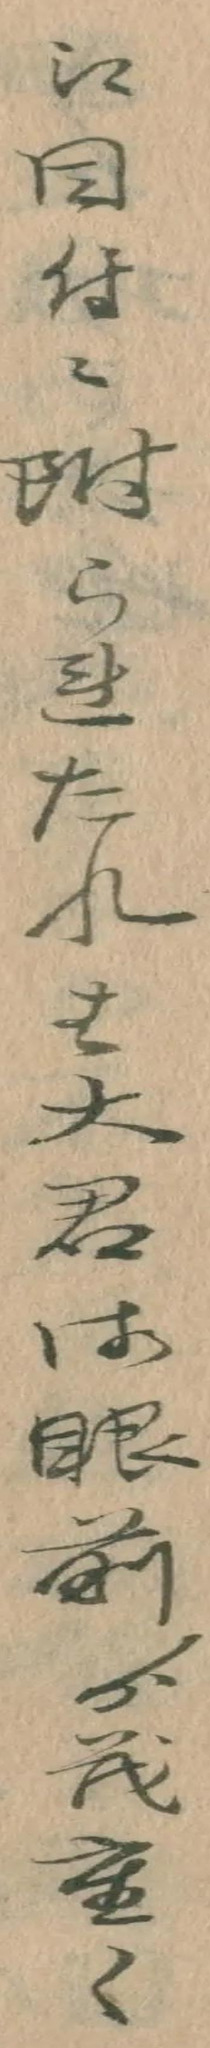江目付に附ら連たれ者大君御眼前ゟ茂重く
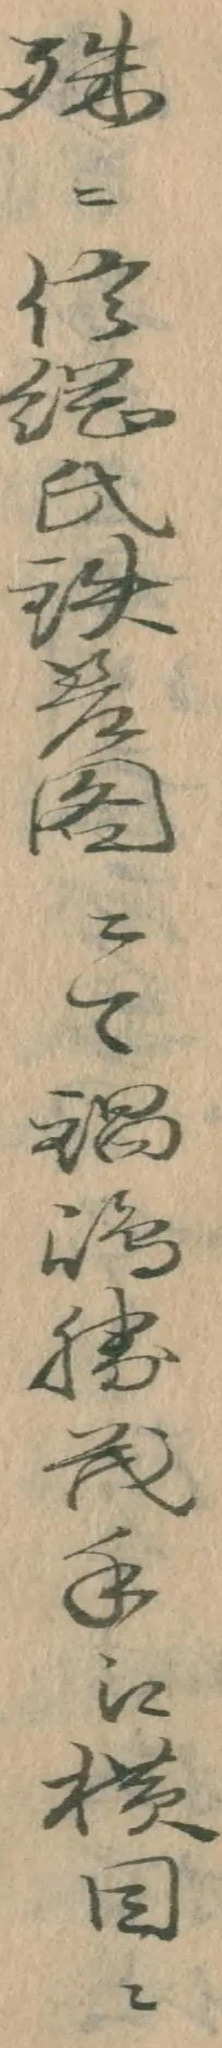殊に信綱氏鉄差図にて鍋島勝茂手江横目に
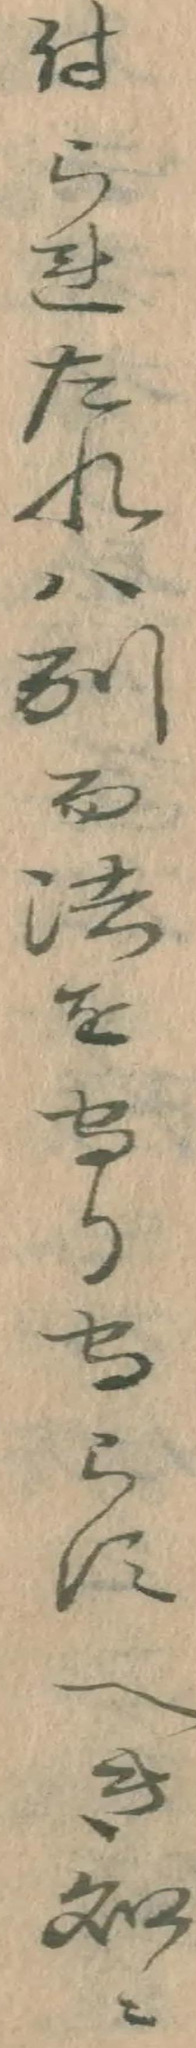付ら連たれは別而法を守り守ら須へき処に
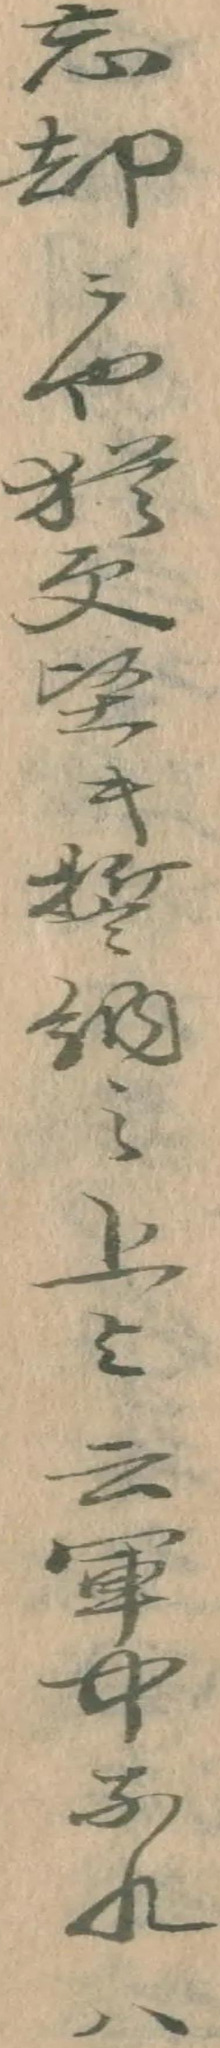忘却にや猶更堅き誓納之上与云軍中なれは
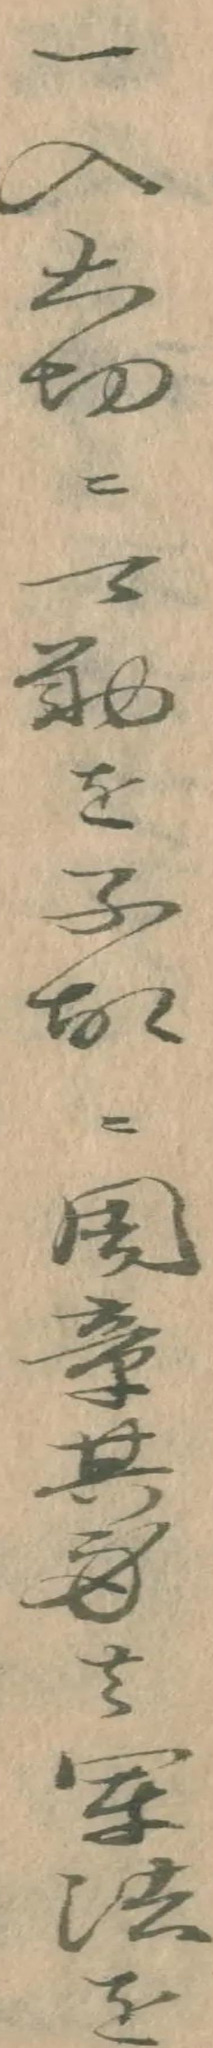一入大切にて勤を子故に周章其身者軍法を
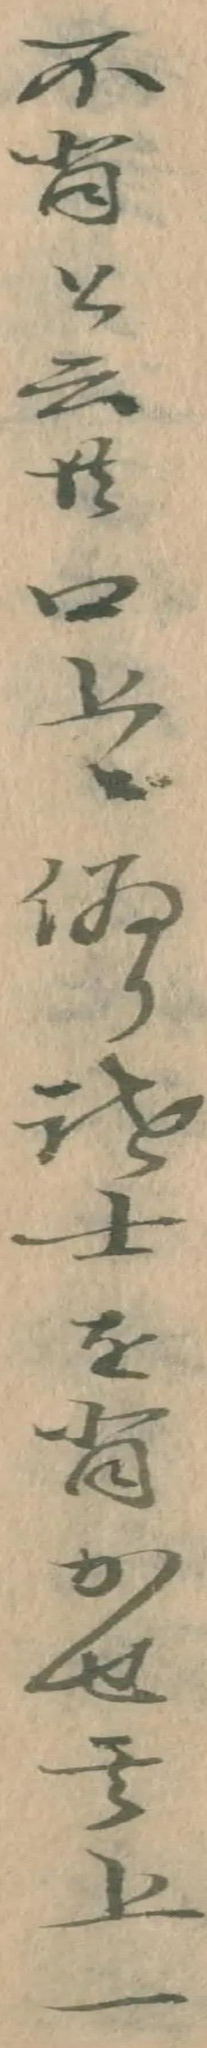不背と云共口上と偽り諸士を背かせ其上一

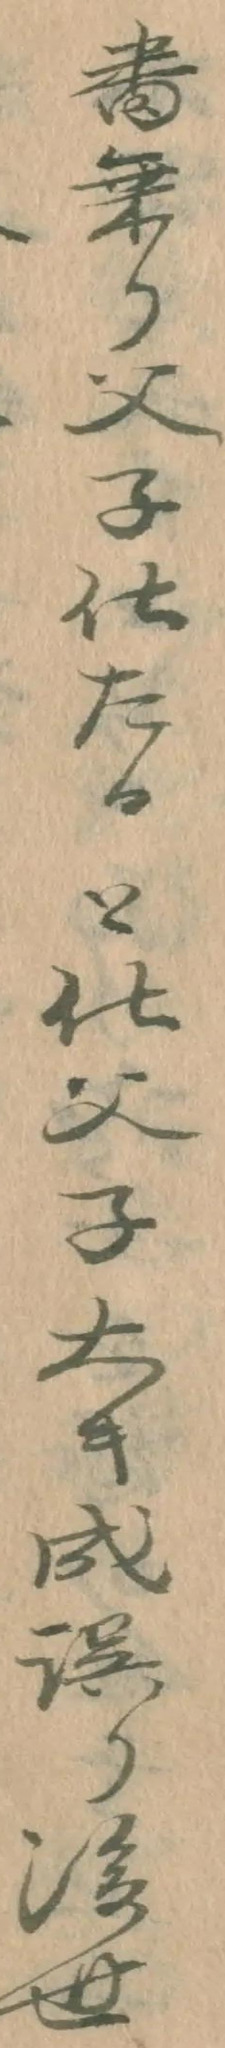番乗り父子仕たると仕父子大き成誤り後世
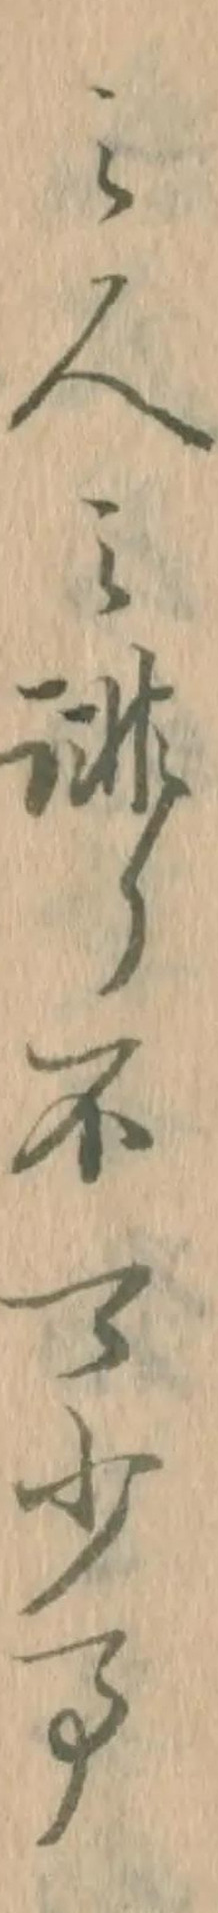之人之誹り不可少事
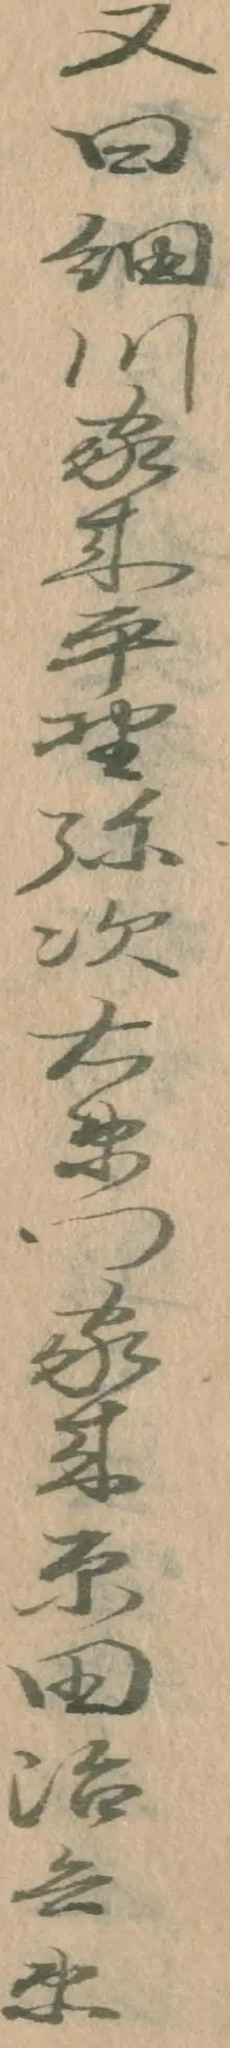又曰細川家来平野弥次右衛門家来原田治兵衛
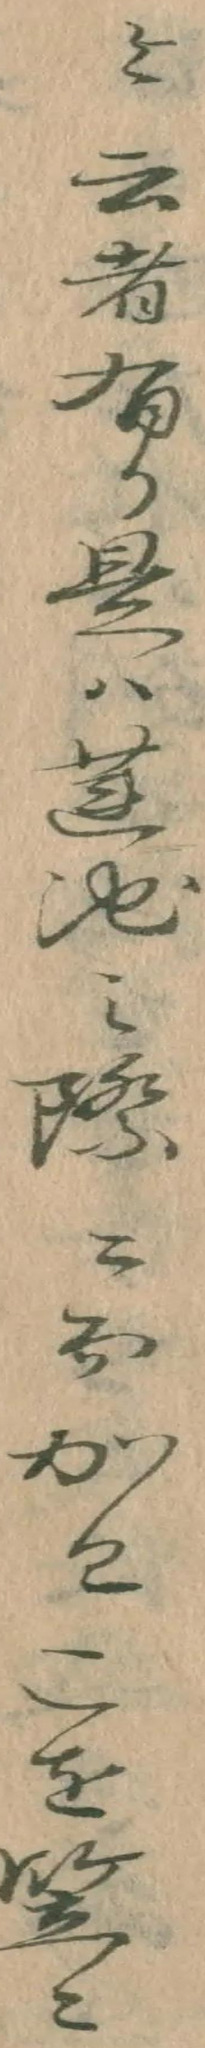と云者有り是は蓮池之際に而加已こを竪に
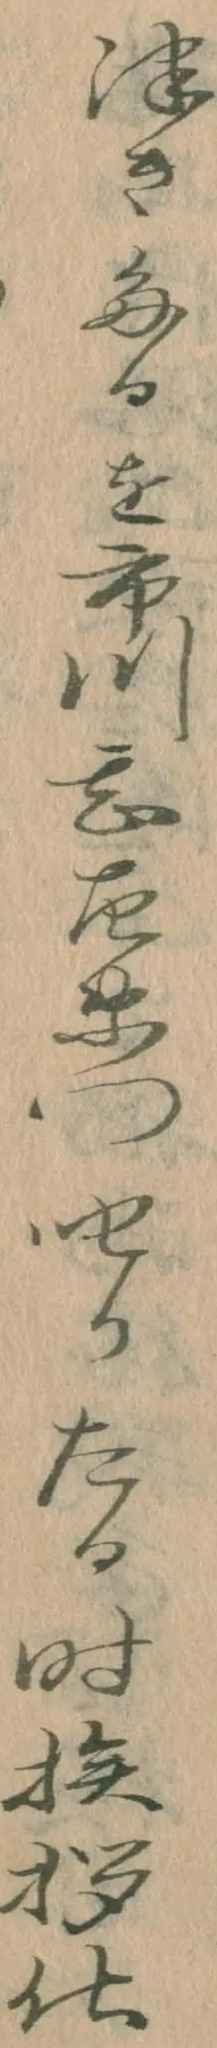津き多るを市川甚左衛門叱りたる時挨拶仕
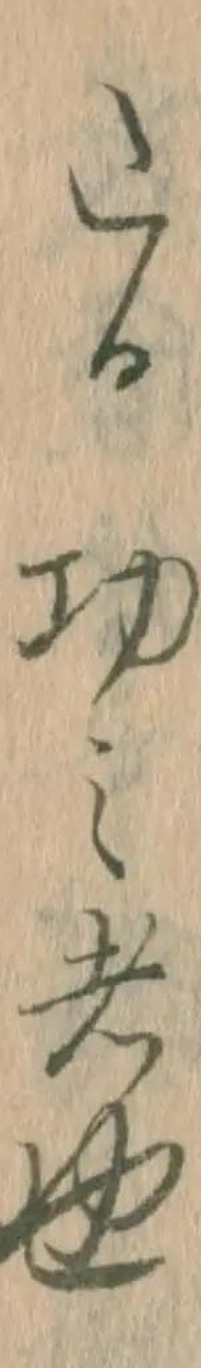たる功之者也
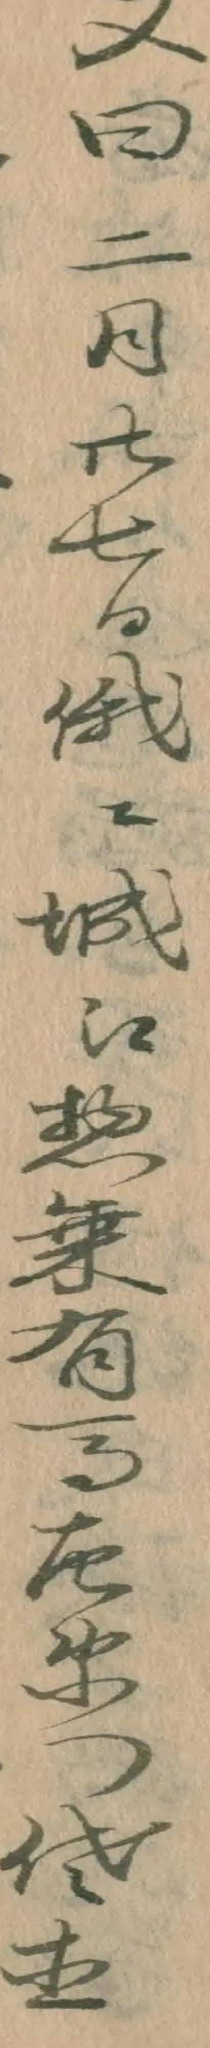又曰二月廿七日俄に城江惣乗有馬左衛門佐直
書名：切支丹御退治記 49巻. [7]
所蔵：国立国会図書館 National Diet Library, JAPAN
